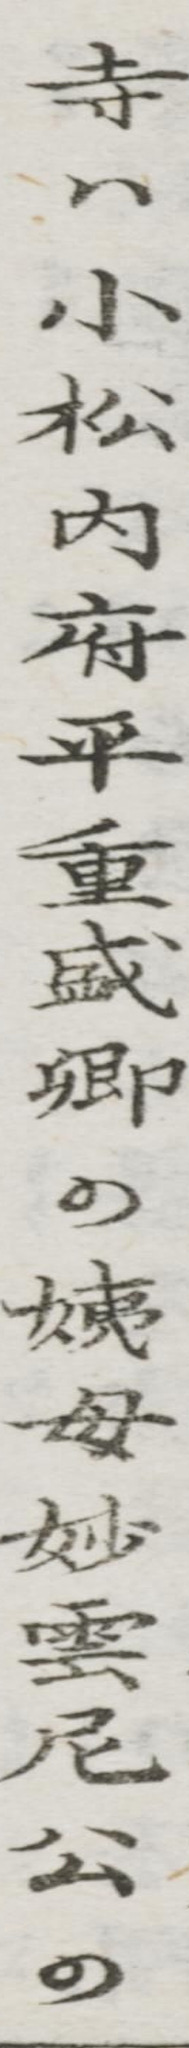寺は小松内府平重盛卿の姨母妙雲尼公の
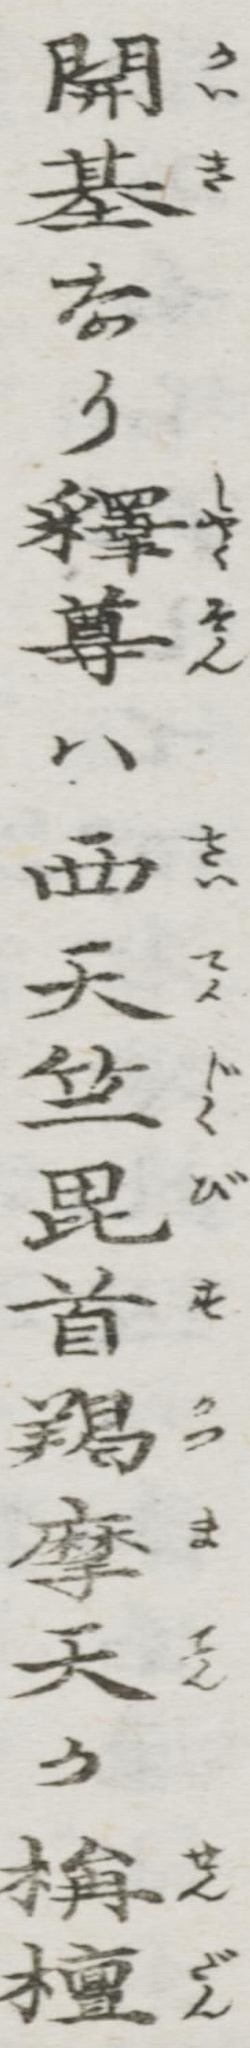開基なり釋尊は西天竺毘首羯摩天か栴檀
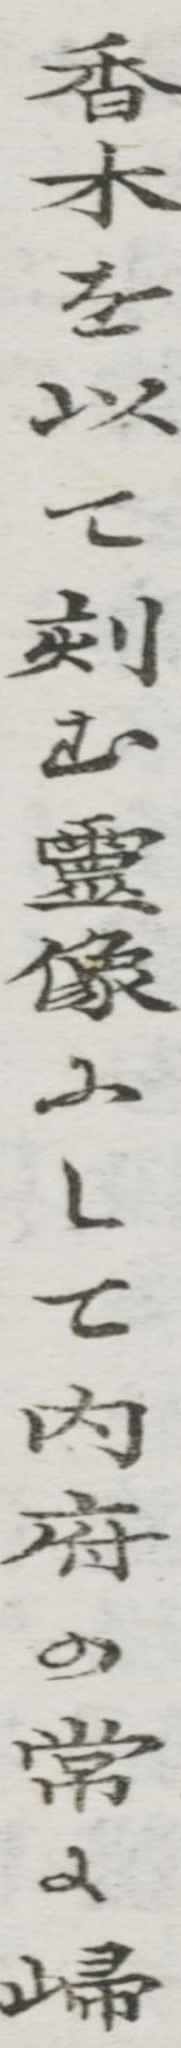香木を以て刻む霊像にして内府の常に帰
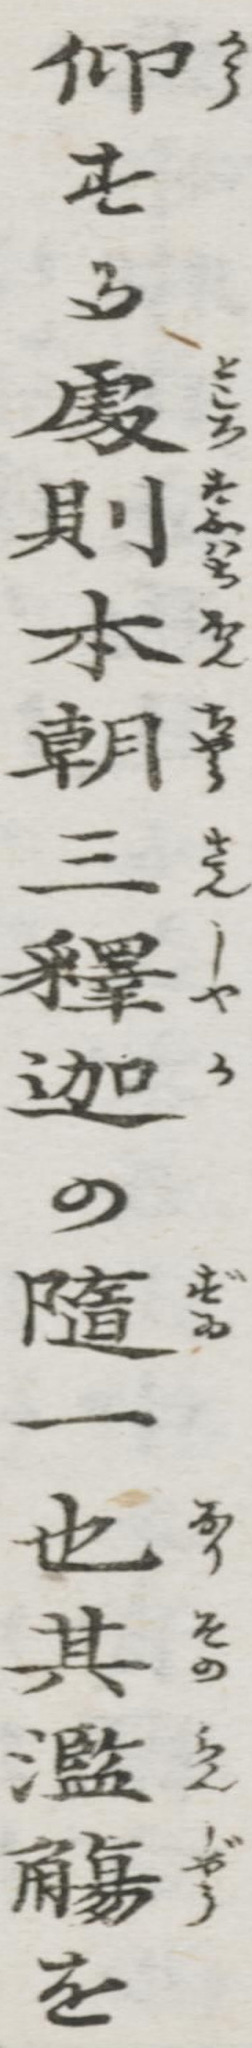仰する處則本朝三釋迦の随一也其濫觴を
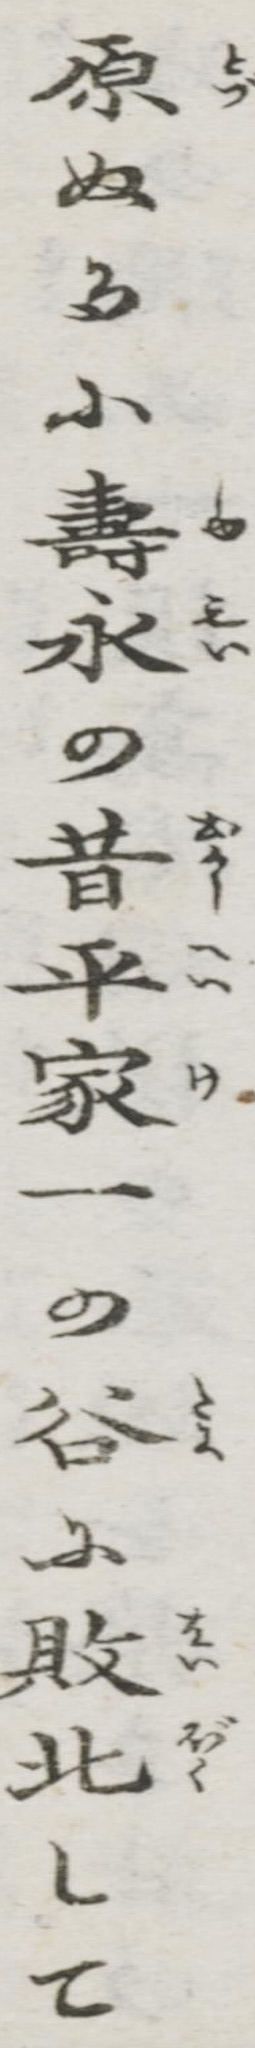原ぬるに壽永の昔平家一の谷に敗北して
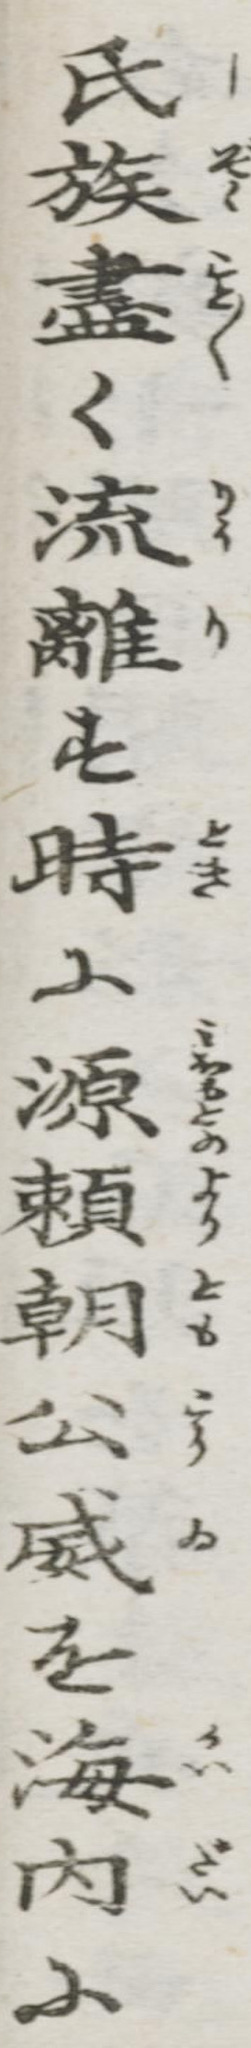氏族儘く流離す時に源頼朝公威を海内に
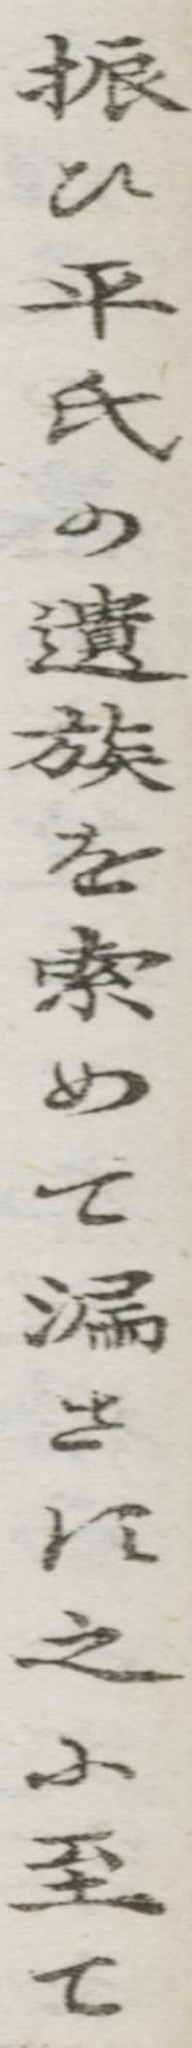振ひ平氏の遺族を索めて漏さす之に至て
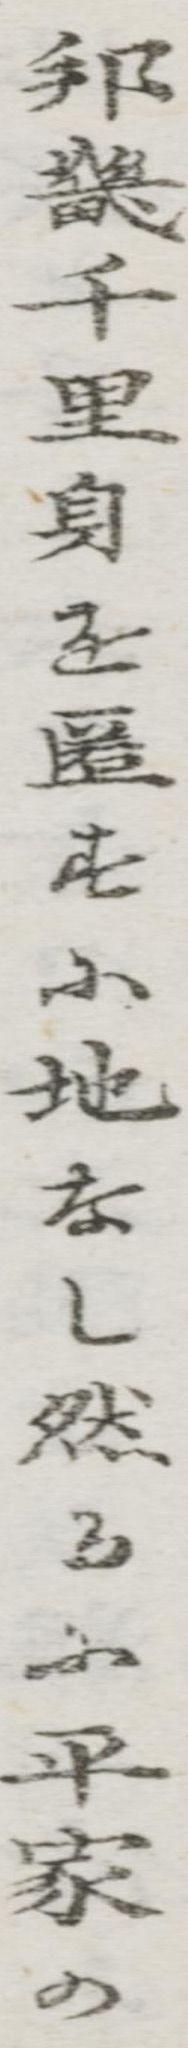邦畿千里身を匿すに地なし然るに平家の
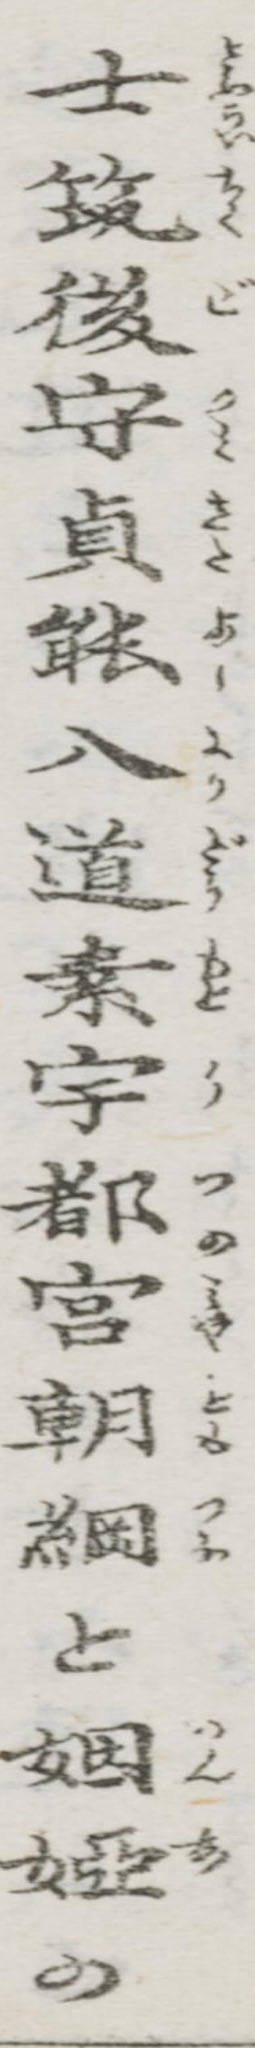士筑後守貞能入道素宇都宮朝綱と姻婭の
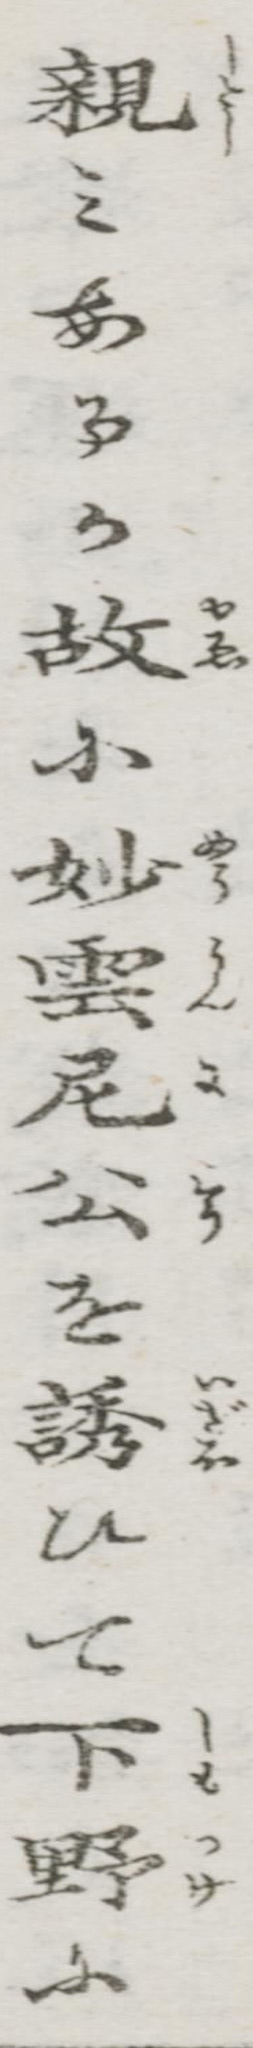親みあるか故に妙雲尼公を誘ひて下野に
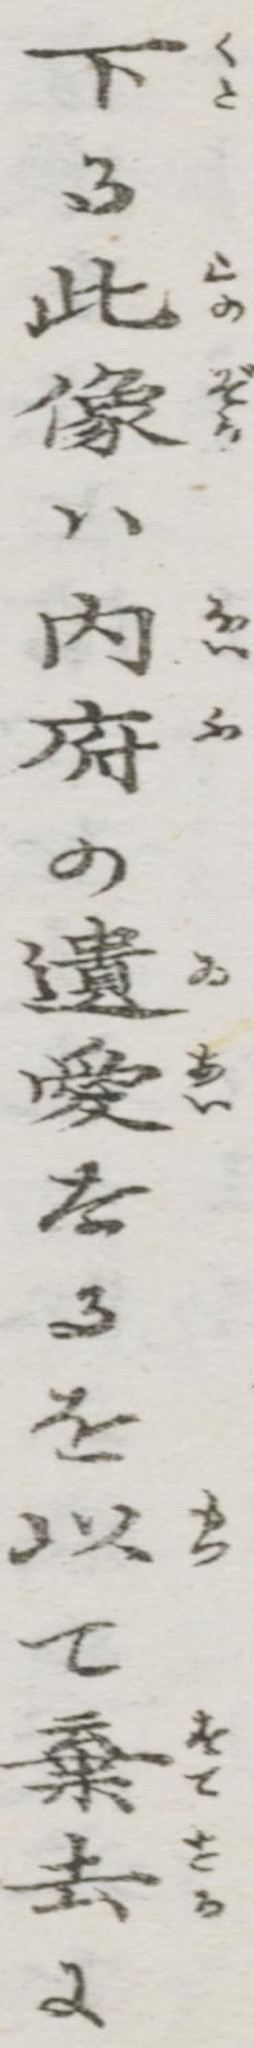下る此像は内府の遺愛なるを以て棄去に
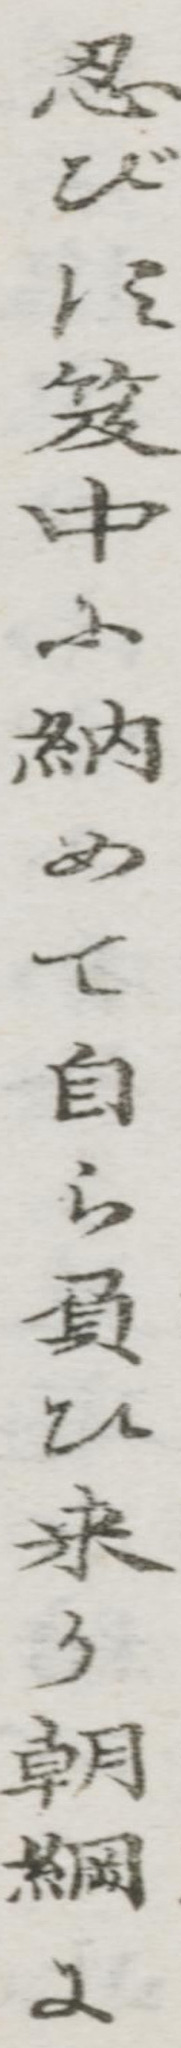忍びす笈中に納めて自ら負ひ来り朝綱に
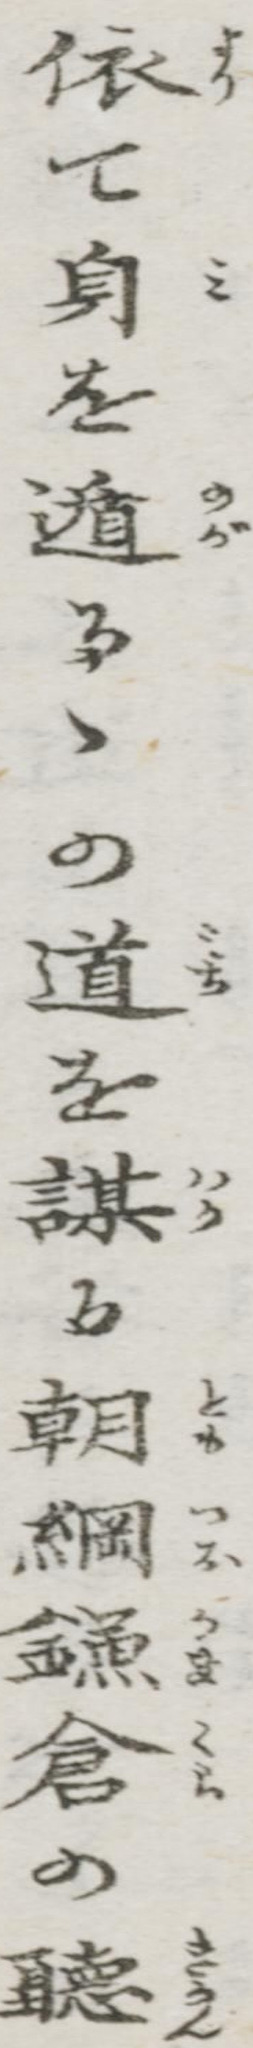依て身を遁るゝの道を謀る朝綱鎌倉の聴
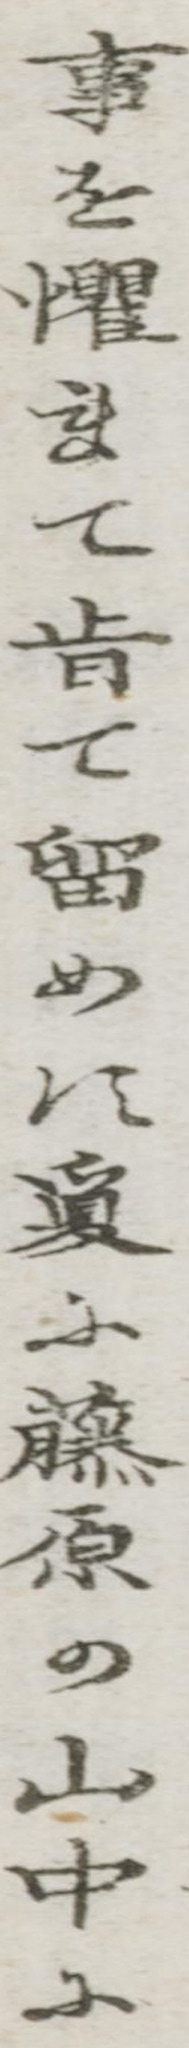事を懼れて肯て留めす夐に藤原の山中に

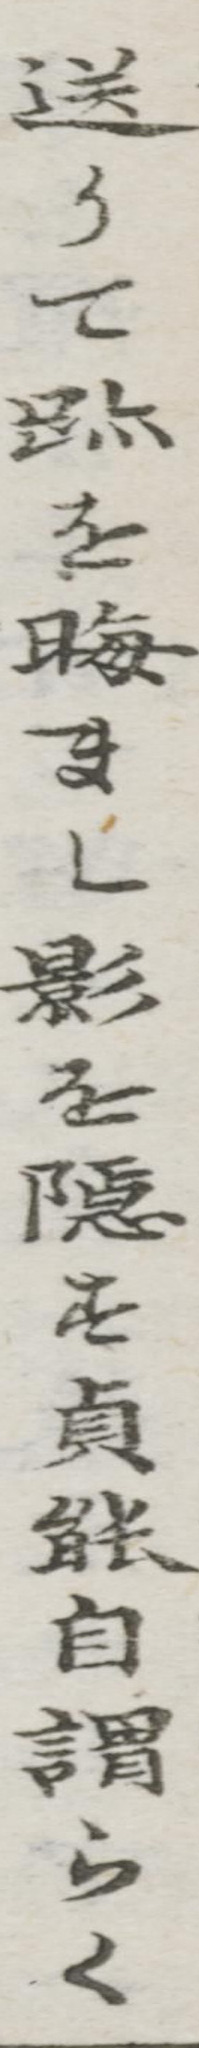送りて跡を晦まし影を隠す貞能自謂らく
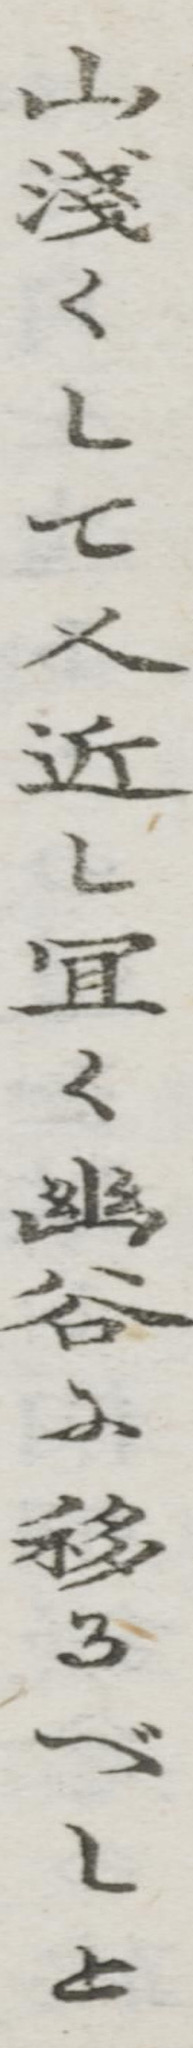山淺くして人近し宜く幽谷に移るべしと
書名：塩原繁昌記　全
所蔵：東京大学地震研究所図書室 Earthquake Research Institute Library, The University of Tokyo, JAPAN
